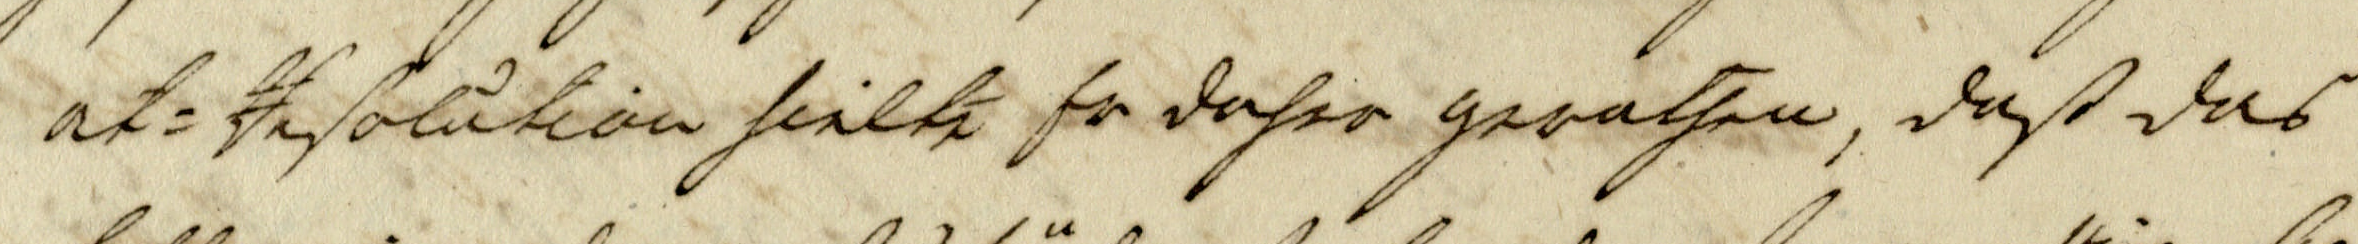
at- Resolution hielte Er daher gerathen, daß das
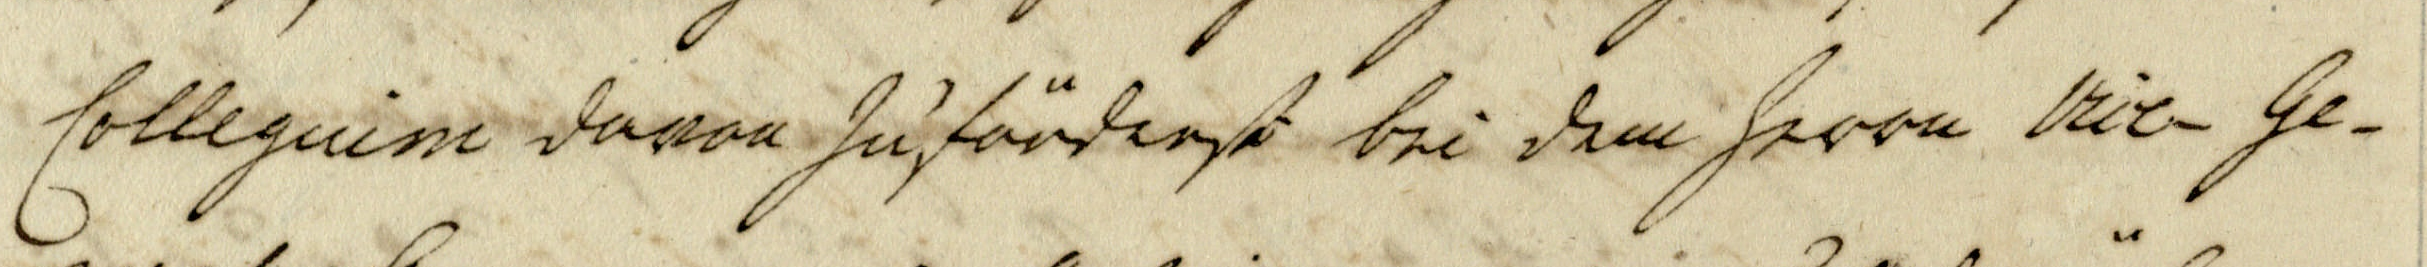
Collegium davon zuförderst bei dem Herrn Vice- Ge¬
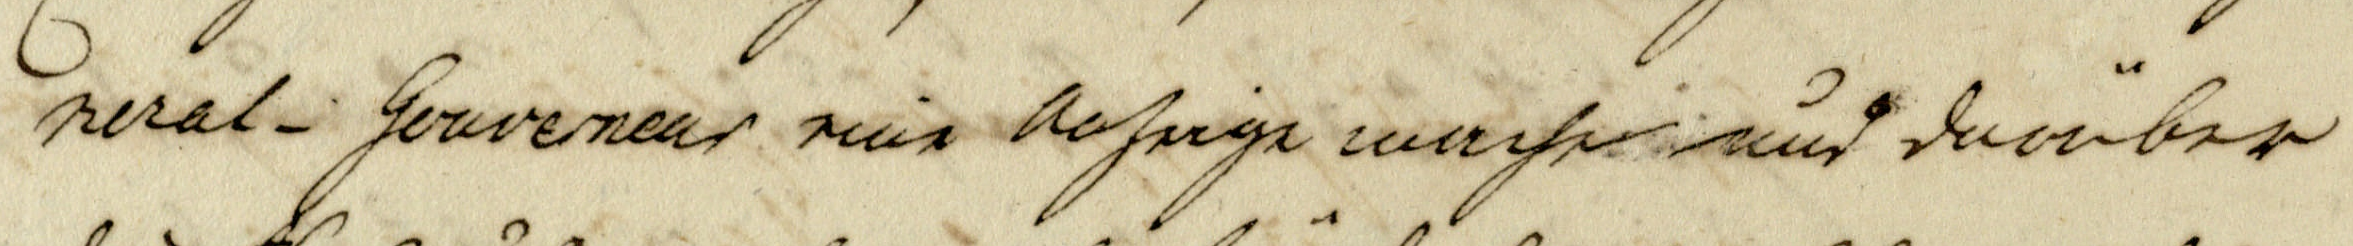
neral- Gouverneur eine Anzeige mache und darüber
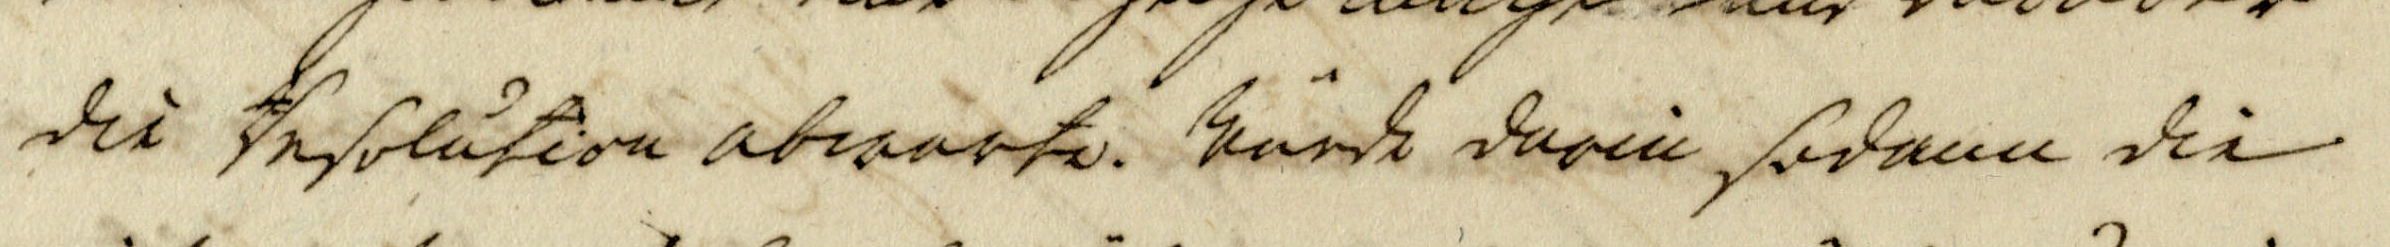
die Resolution abwarte. Würde darin sodann die
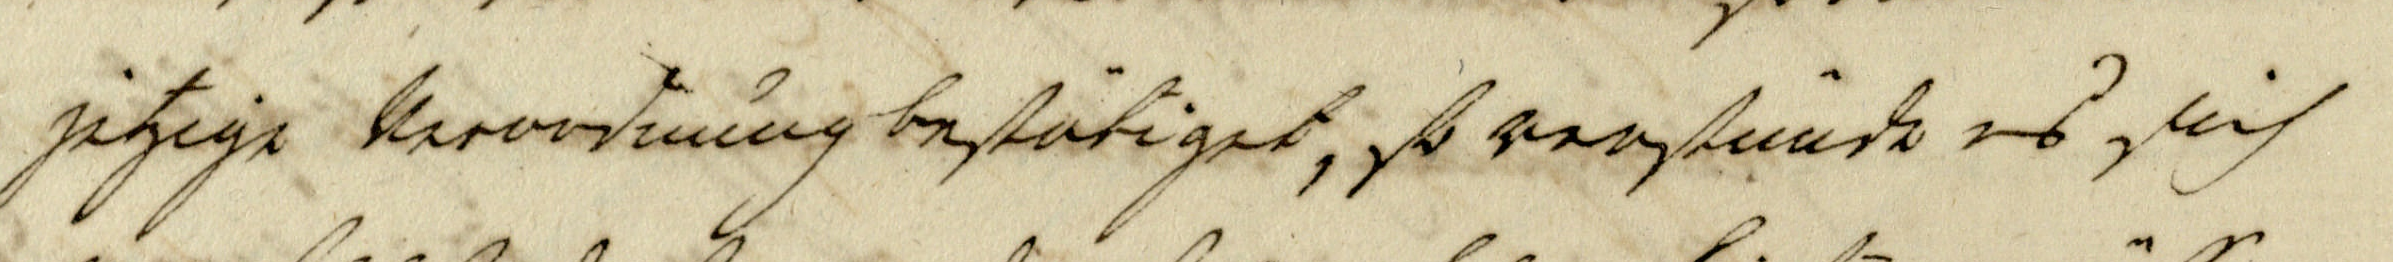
jetzige Verordnung bestätiget, so verstünde es sich
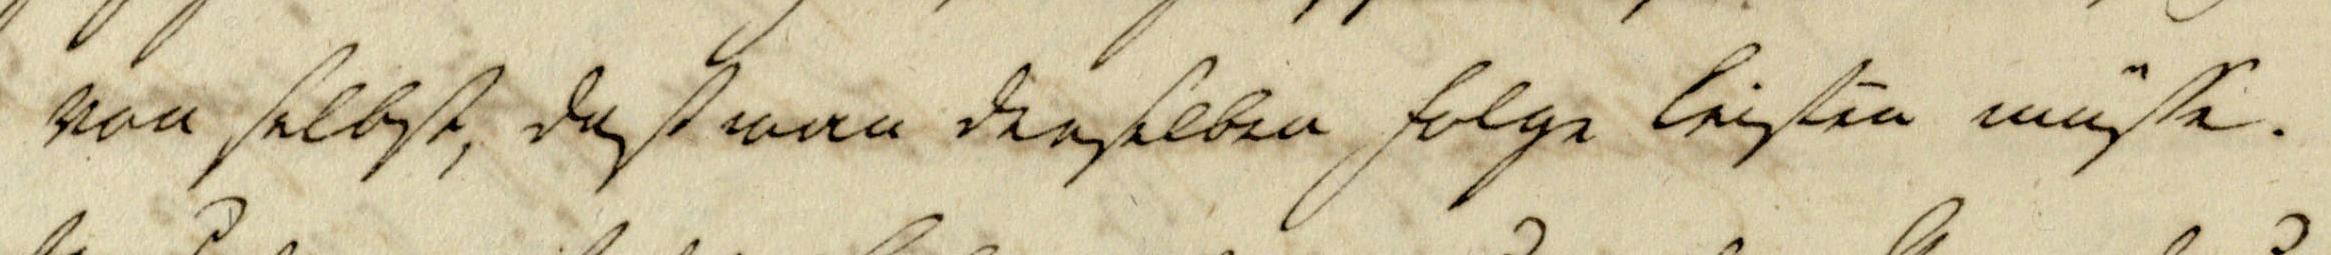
von selbst, daß man derselben Folge leisten müsse.
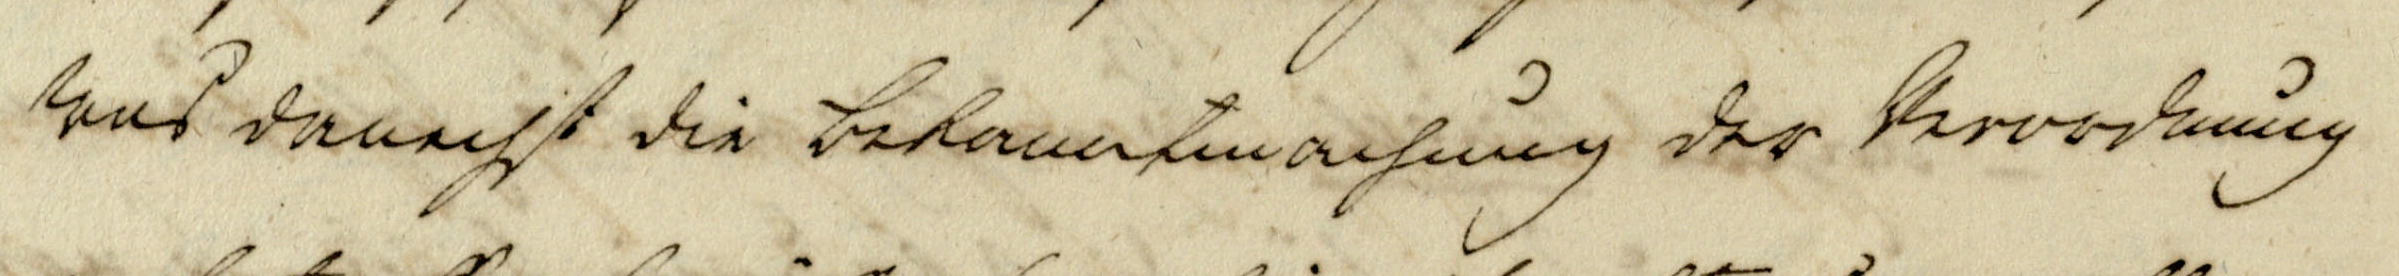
Was danechst die Bekanntmachung der Verordnung
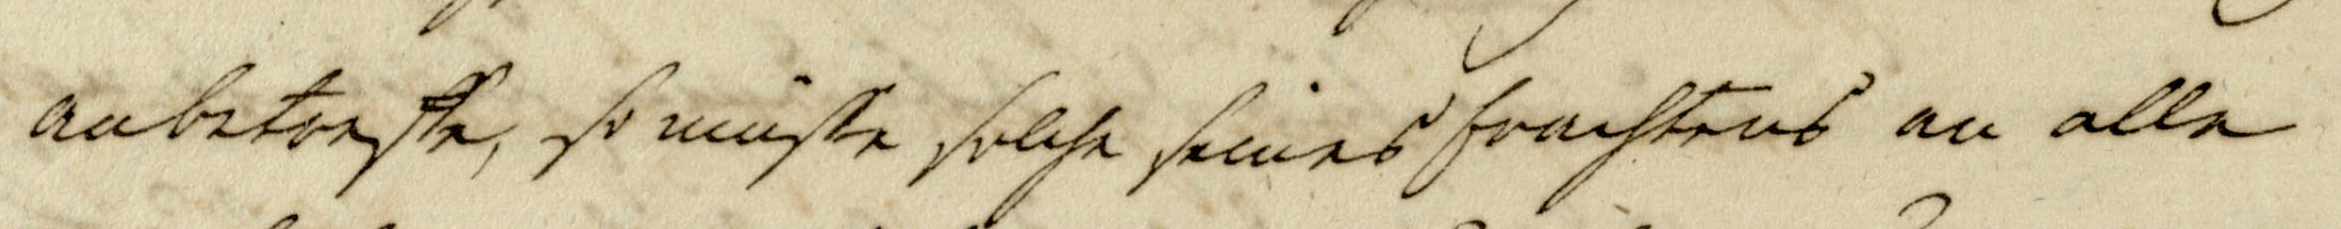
anbetreffe, so müsse solche seines Erachtens an alle
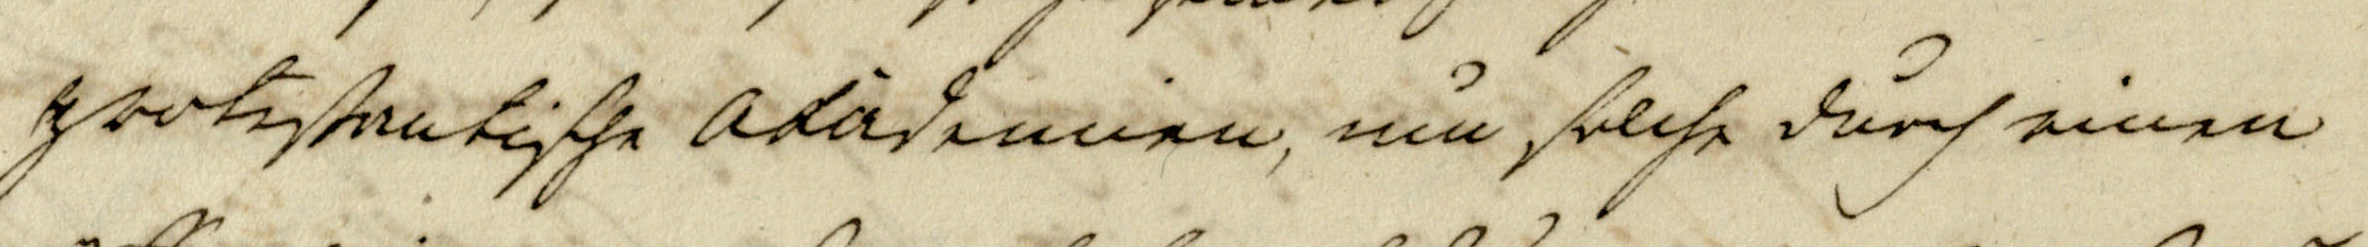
protestantische Akademien, um solche durch einen
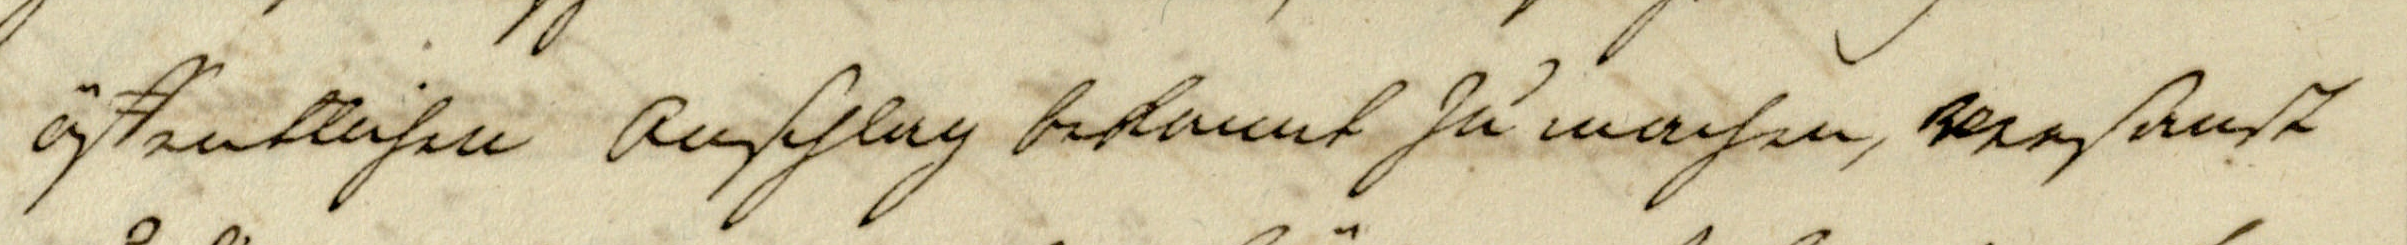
öffentlichen Anschlag bekannt zu machen, versandt
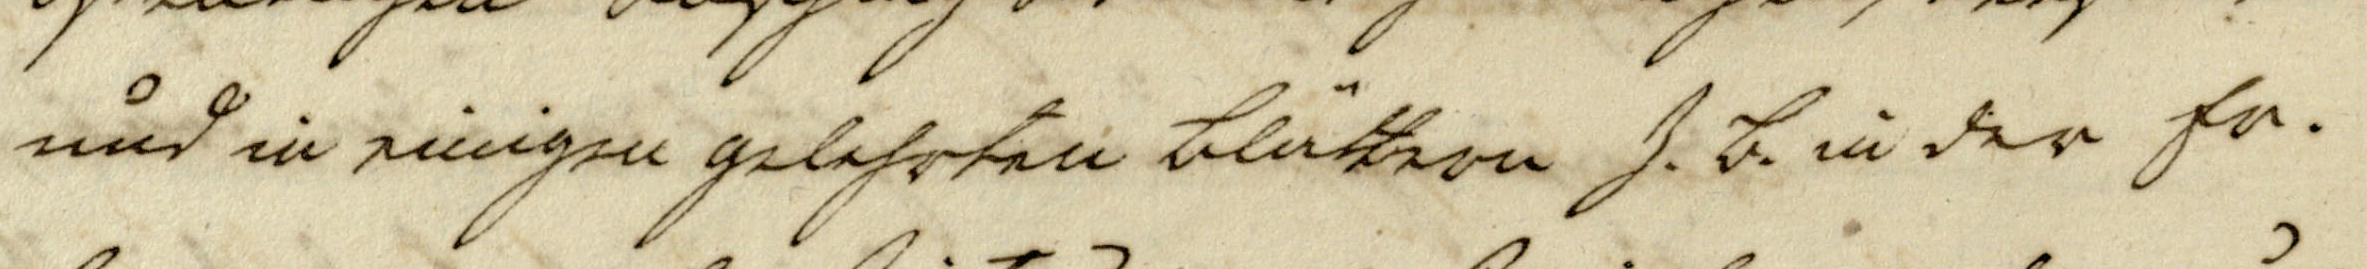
und in einigen gelehrten Blätterm z. B. in der Er¬
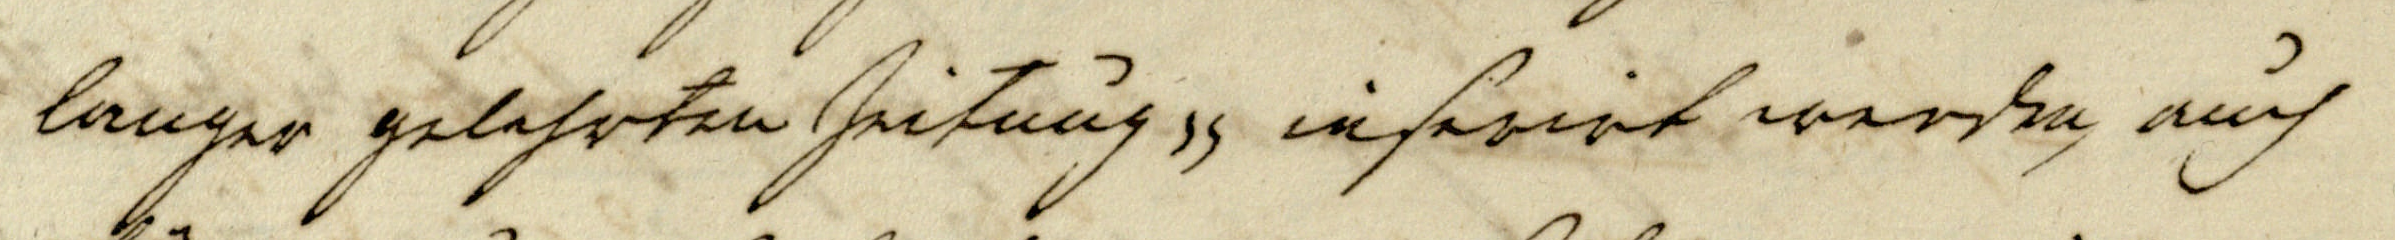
langer gelehrten Zeitung inserirt werden, auch
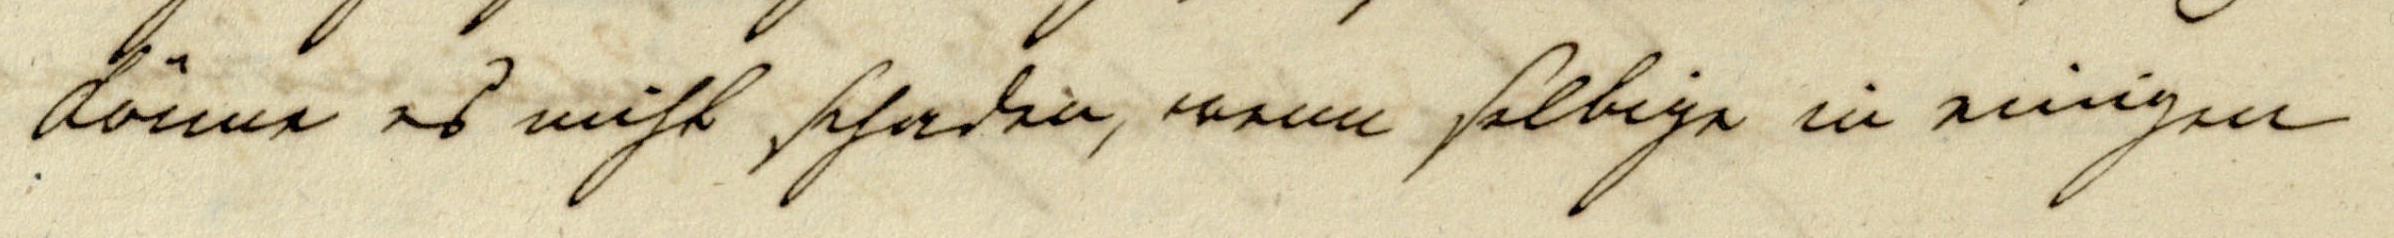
könne es nicht schaden, wenn selbige in einigen
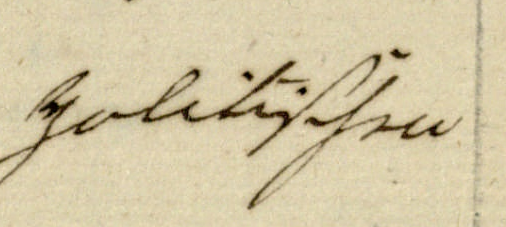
politischen
